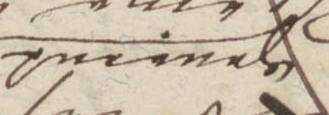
Sie liegen
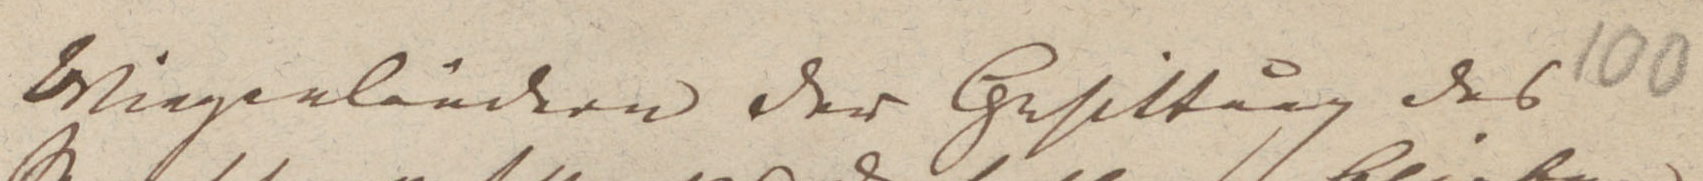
Wiegenländern der Gesittung des
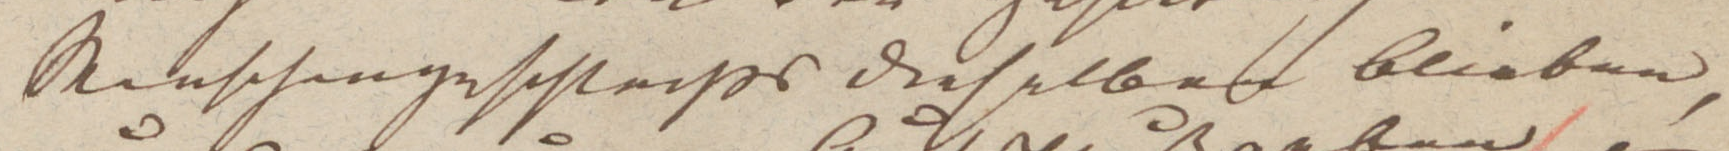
Menschengeschlechts dieselben blieben,
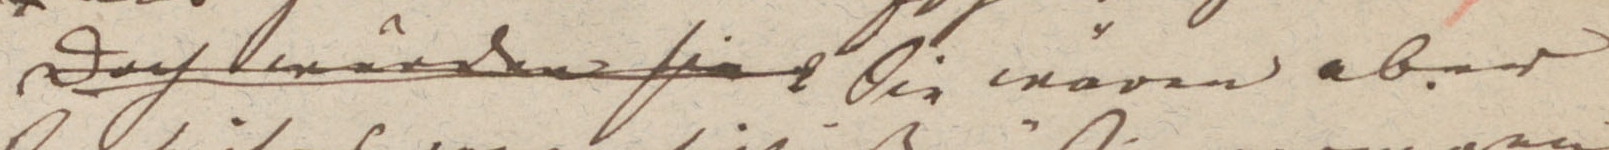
Doch würden sie Sie wären aber
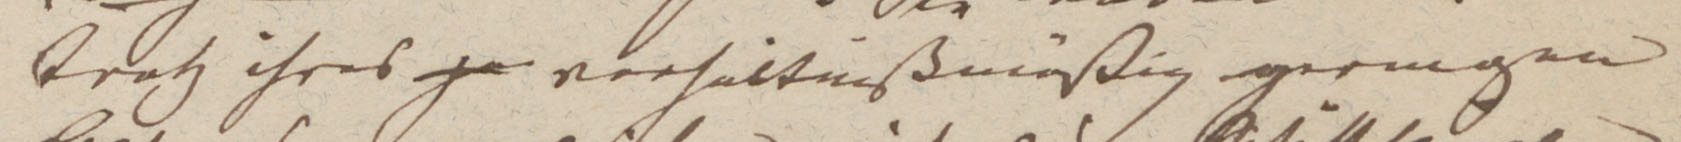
trotz ihres verhältnissmässig geringen
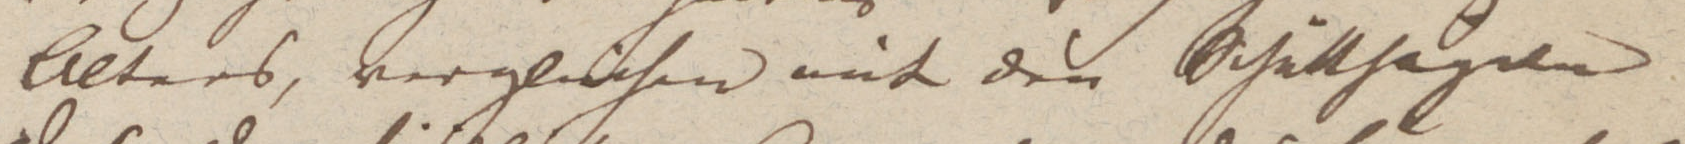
Alters, verglichen mit den Schutthügeln
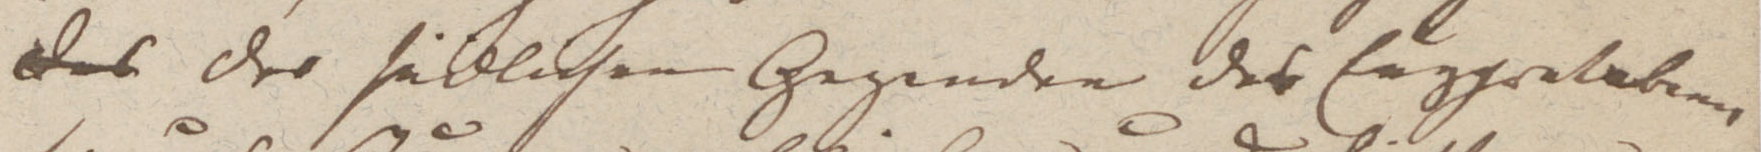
des der südlichen Gegenden desr Euphrateben
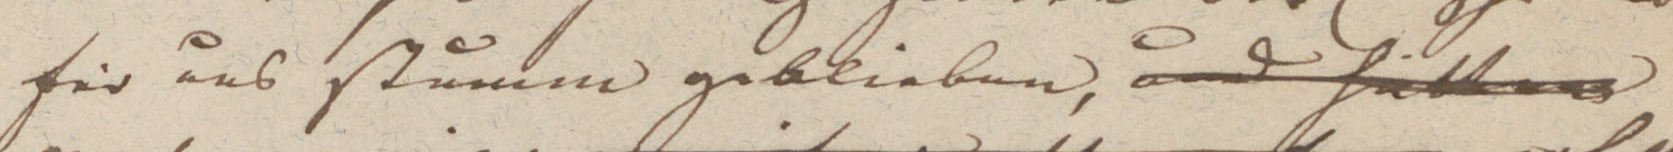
für uns stumm geblieben, und hätten
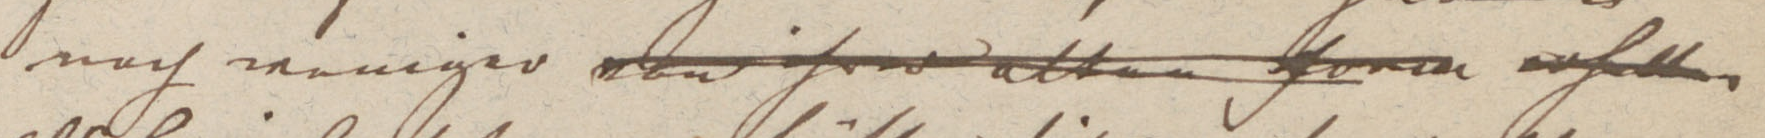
noch weniger von ihrer alten Form erhalten
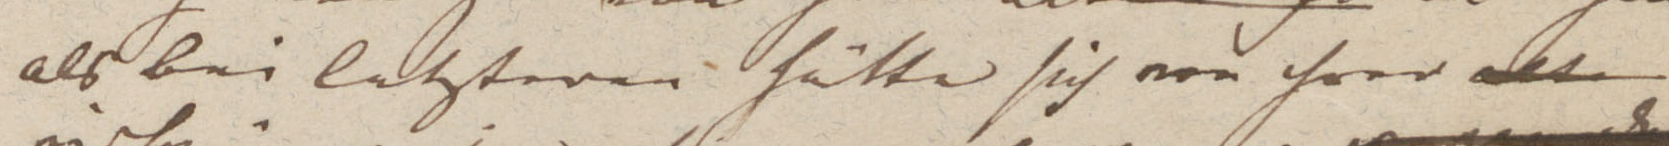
als bei letzteren hätte sich von ihrer alte
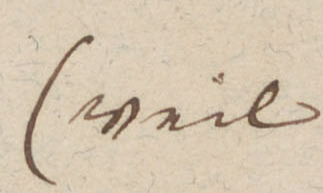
(weil
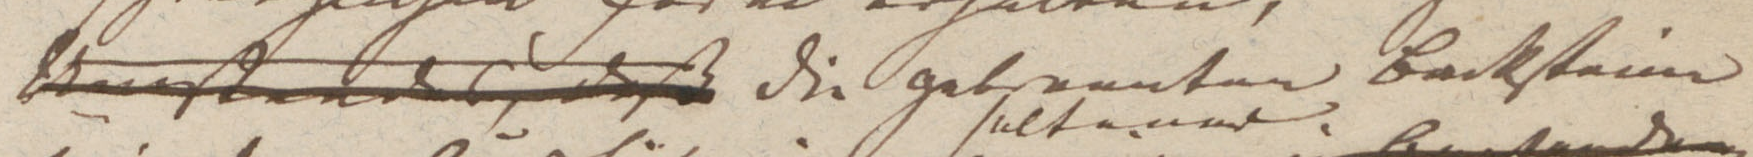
Umstandes, dass die gebrannten Backsteine
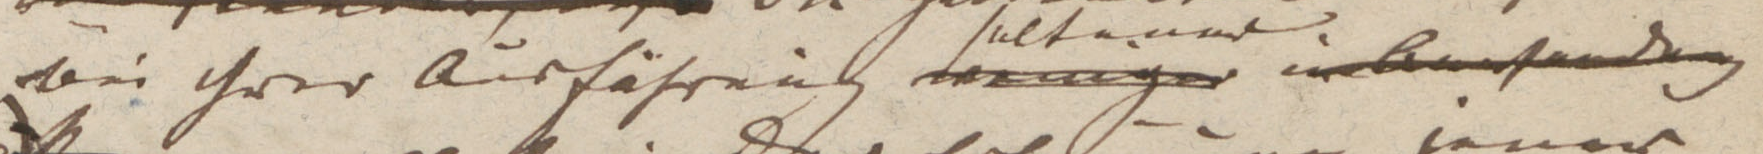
bei ihrer Ausführung weniger seltener in Anwendung
